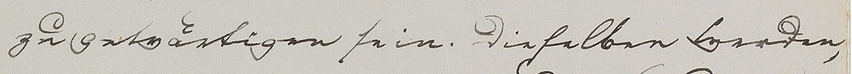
zu gewärtigen sein. Dieselben werden,
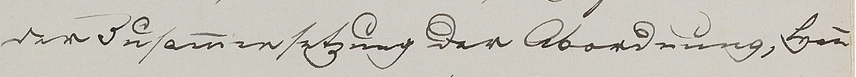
der Zusammensetzung der Abordnung, wenn
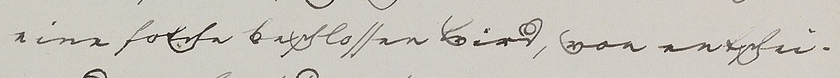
eine solche beschlossen wird, von entschei-
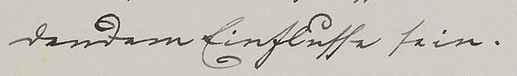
dendem Einflusse sein.
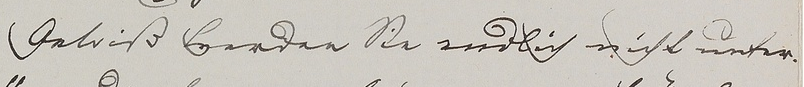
Gewiß werden Sie endlich nicht unter-
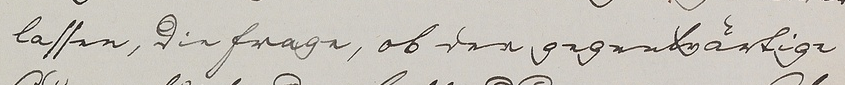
lassen, die Frage, ob der gegenwärtige
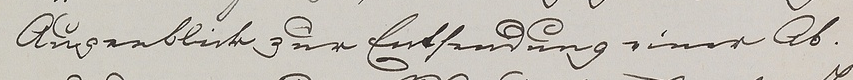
Augenblick zur Entsendung einer Ab-
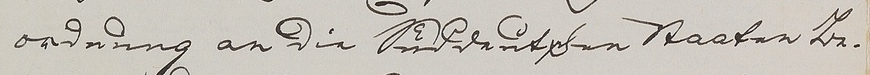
ordnung an die Süddeutschen Staaten Be-
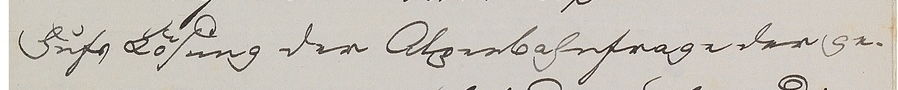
hufs Lösung der Alpenbahnfrage der ge-
